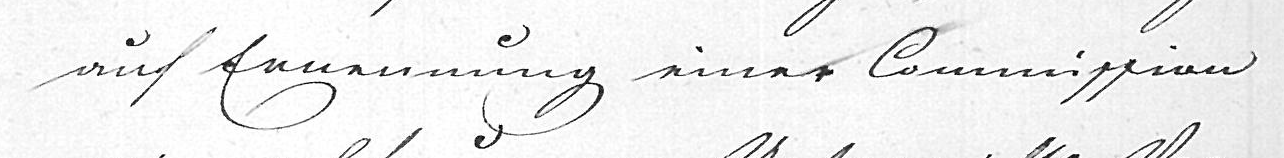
auf Ernennung einer Commission
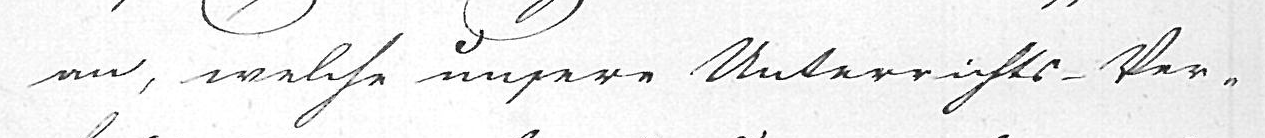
an, welche unsere Unterichts-Ver-
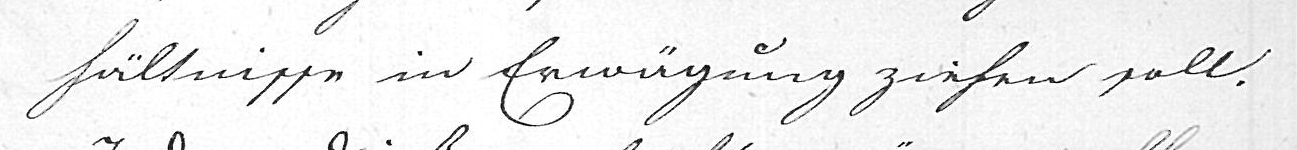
hältnisse in Erwägung ziehen soll.
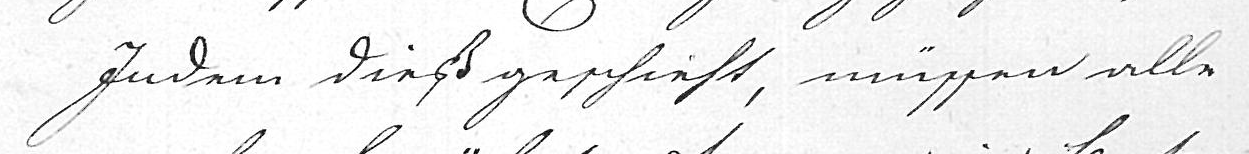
Indem dieß geschieht müssen alle
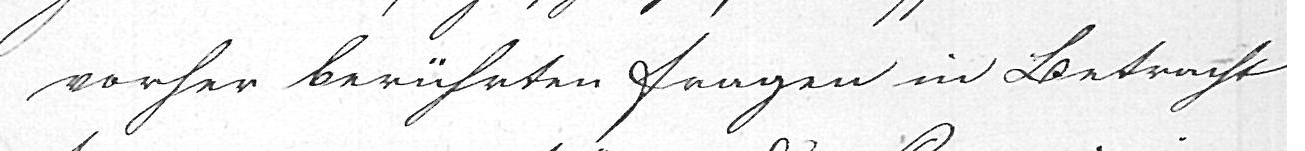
vorher berührten Fragen in Betracht
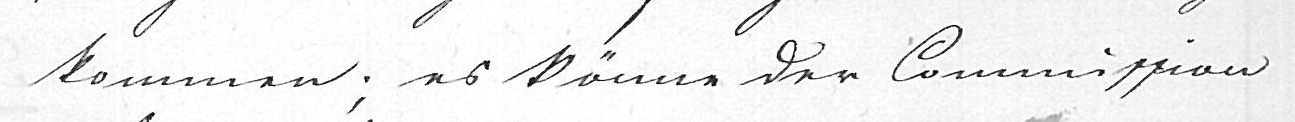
kommen; es könne der Commission
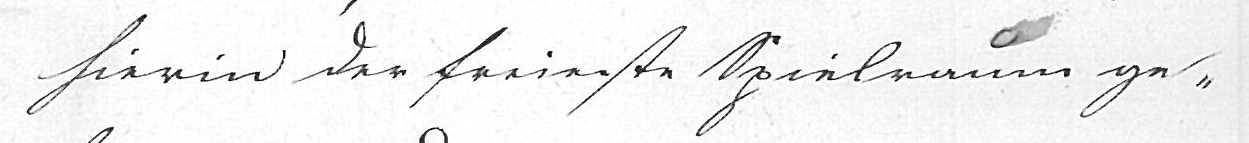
hierin der freieste Spielraum ge-
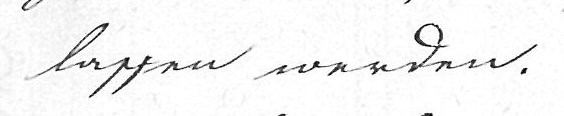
lassen werden.
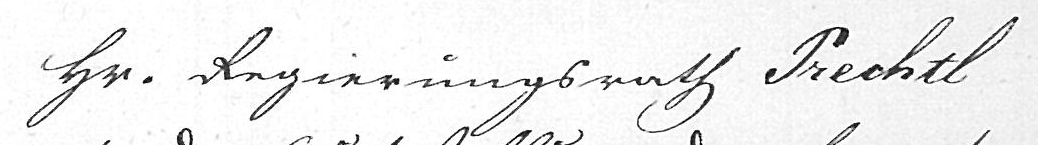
Hr. Regierungsrath Prechtl
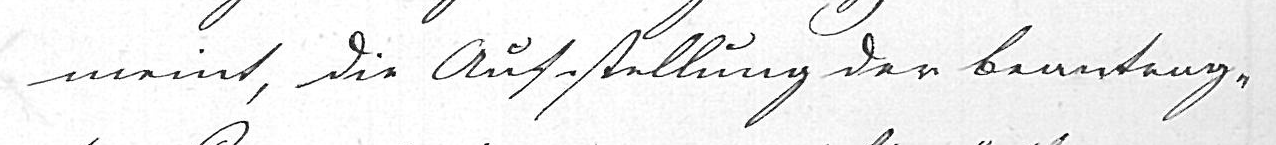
meint, die Aufstellung der beantrag-
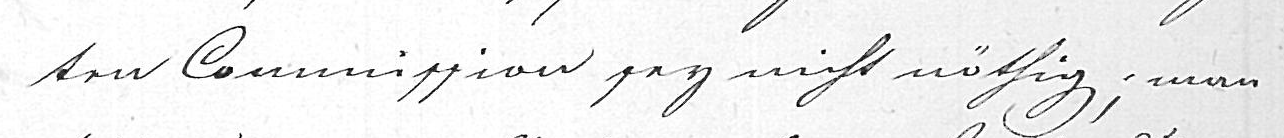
ten Commission sey nicht nöthig; man
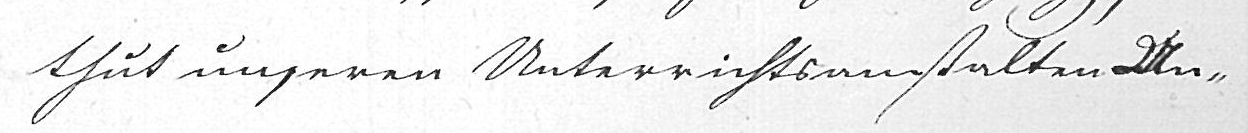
thut unseren Unterrichtsanstalten Un-
